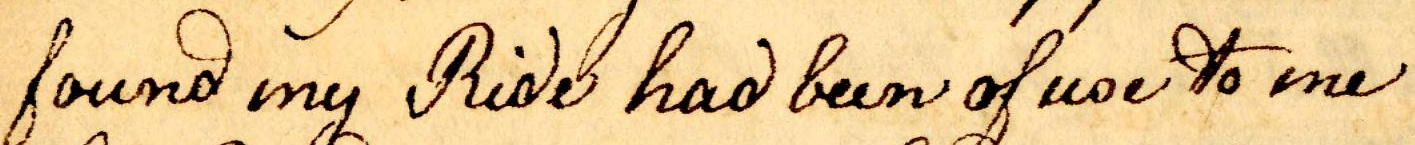found my Ride had been of use to me
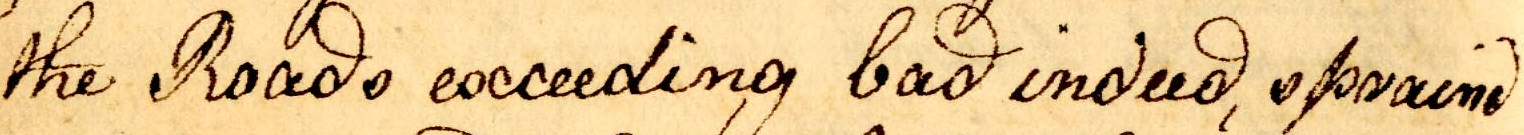the Roads exceeding bad indeed, spraind
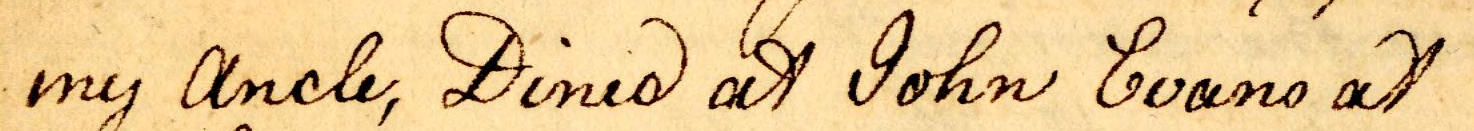my Ancle, Dined at John Evans at
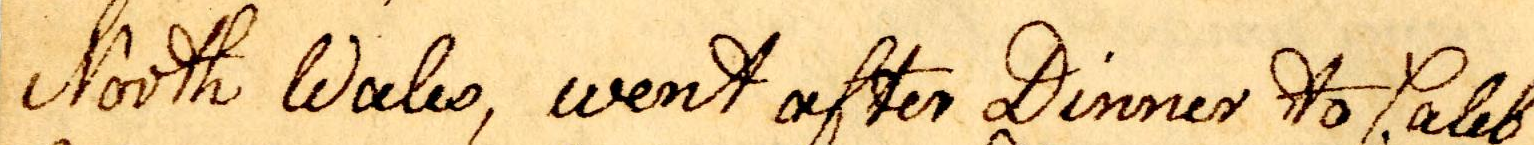North Wales, went after Dinner to Caleb
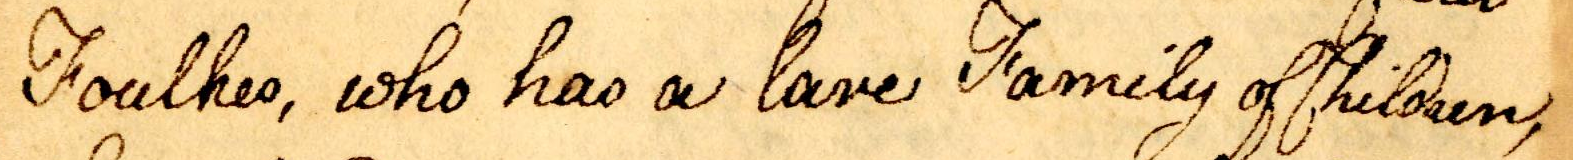Foulkes, who has a lare Family of Children,
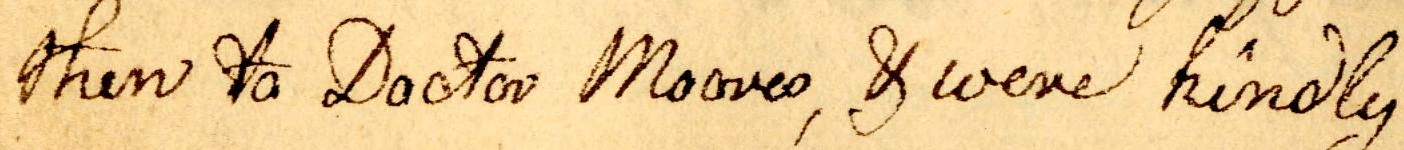them to Doctor Moores, & were kindly
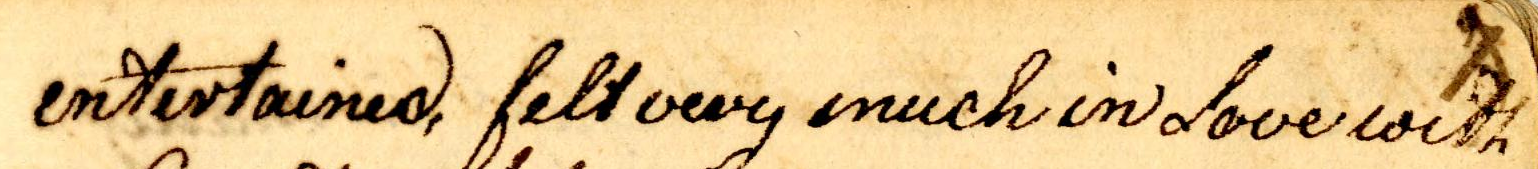entertained, felt very much in Love with
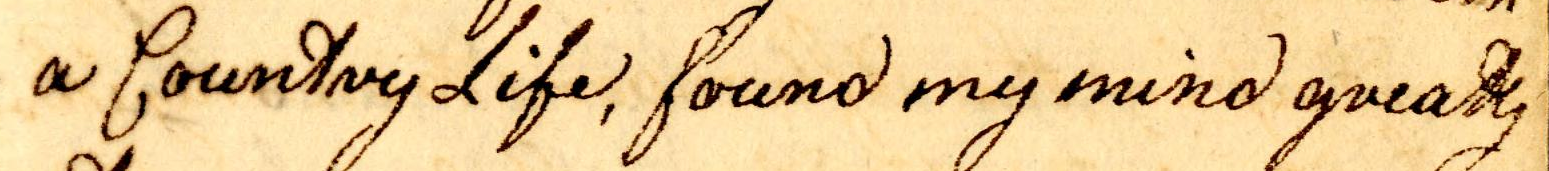a Country Life, found my mind greatly
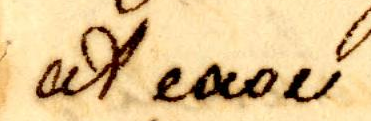at ease
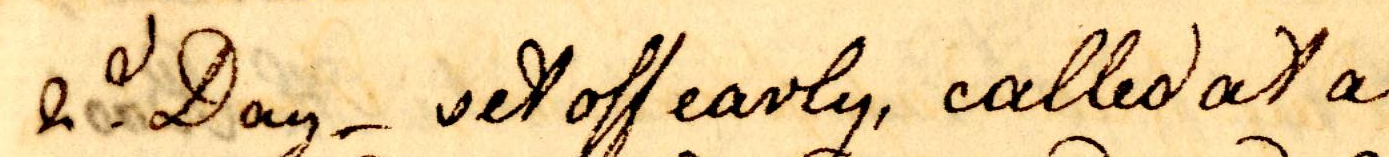2^d Day- set off early, called at a
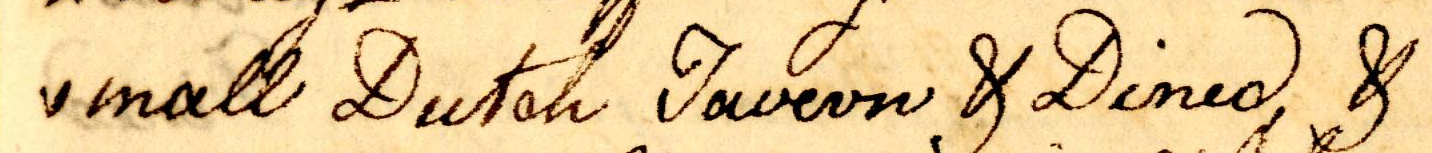small Dutch Tavern & Dined, &
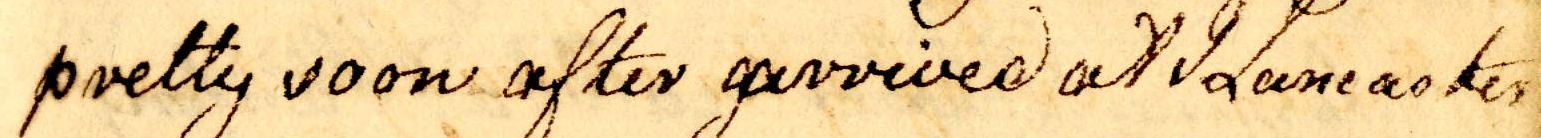pretty soon after garrived at I Lancaster
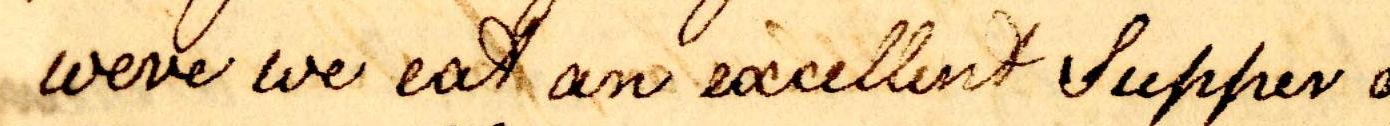were we eat an excellent Supper of
